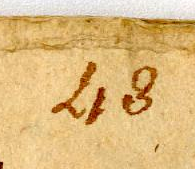43
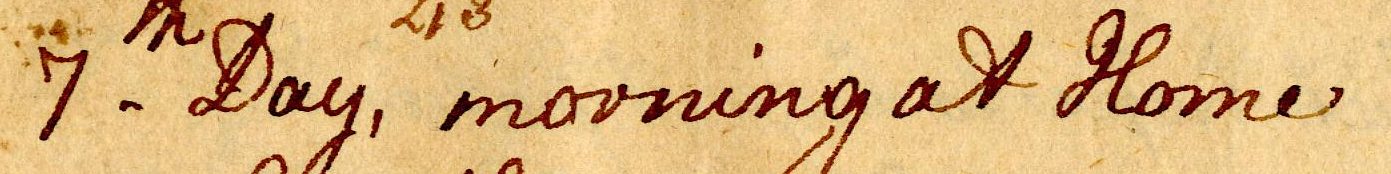7^th Day, morning at Home
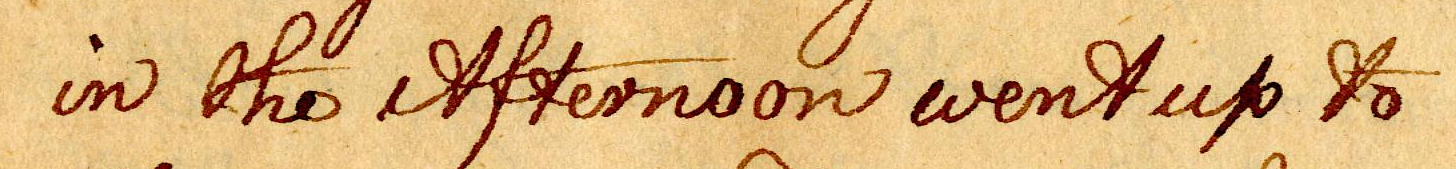in the Afternoon went up to
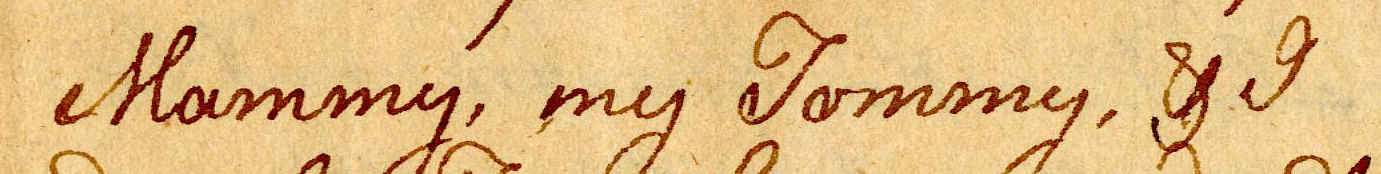Mammy, my Tommy, & I
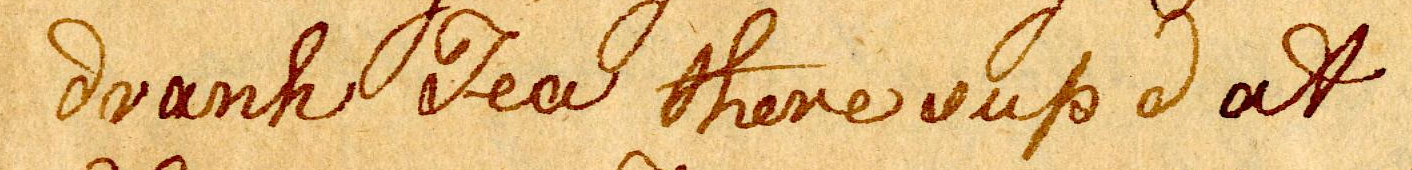drank Tea there supd at
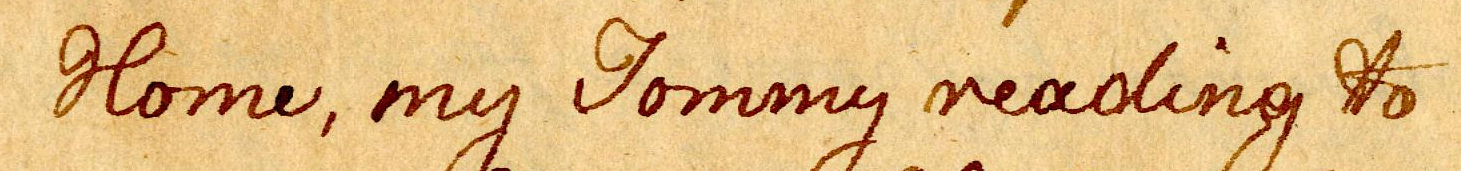Home, my Tommy reading to
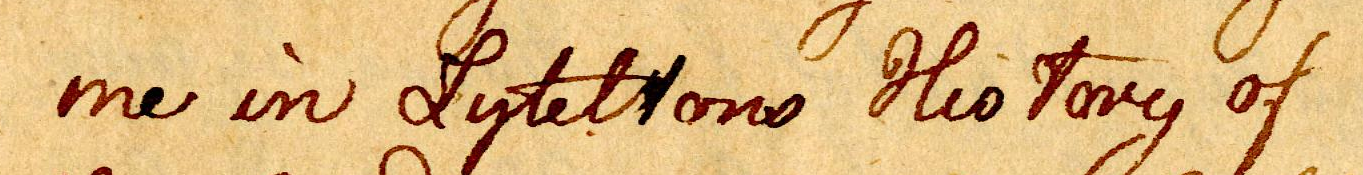me in Lyteltons History of
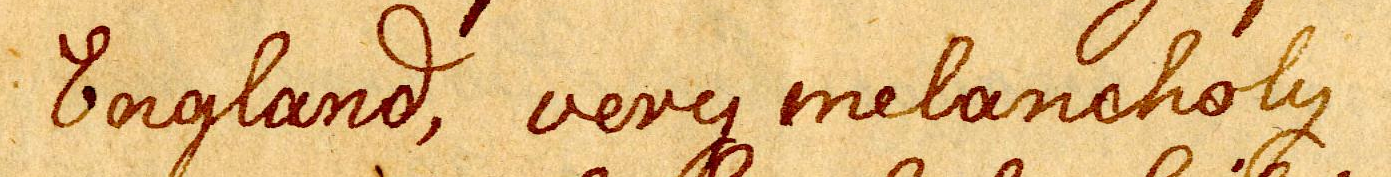England, very melancholy
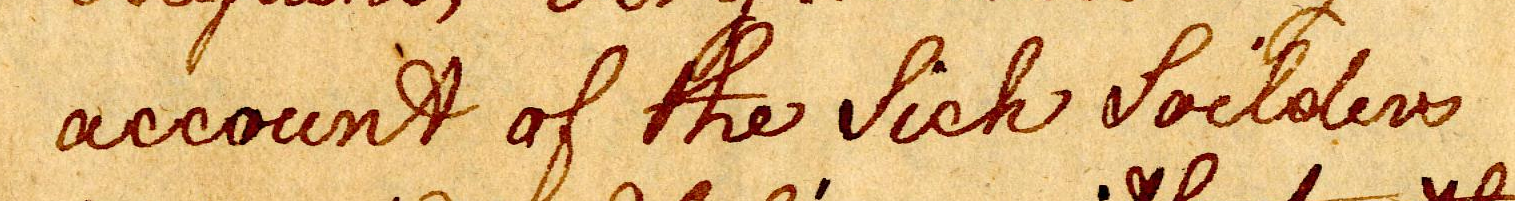account of the Sick Soldiers
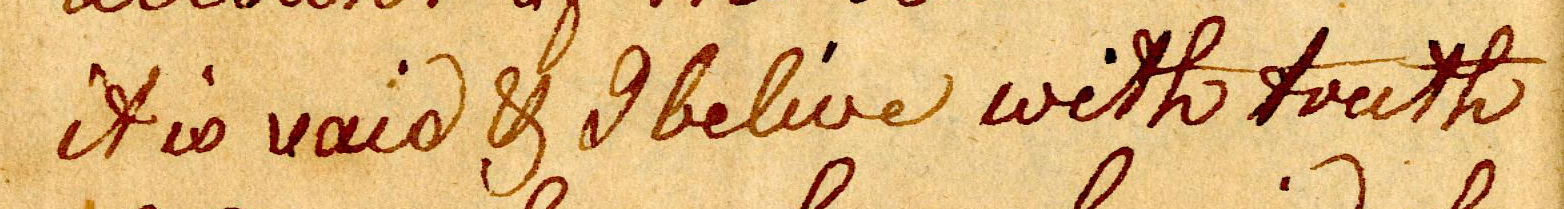it is said & I belive with truth
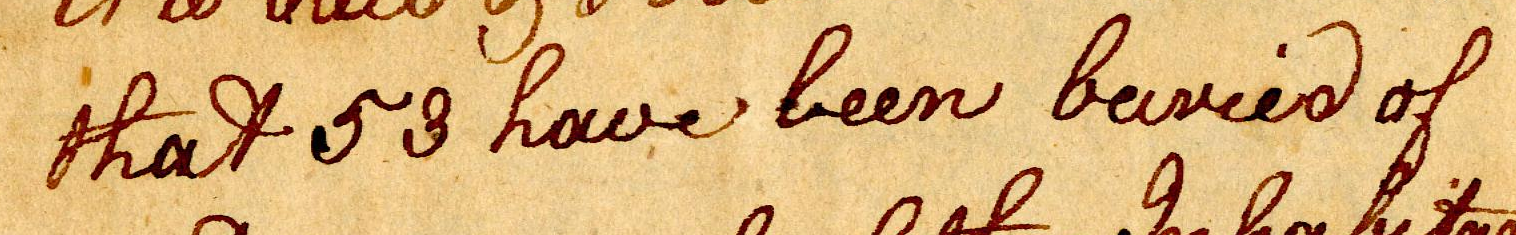that 53 have been buried of
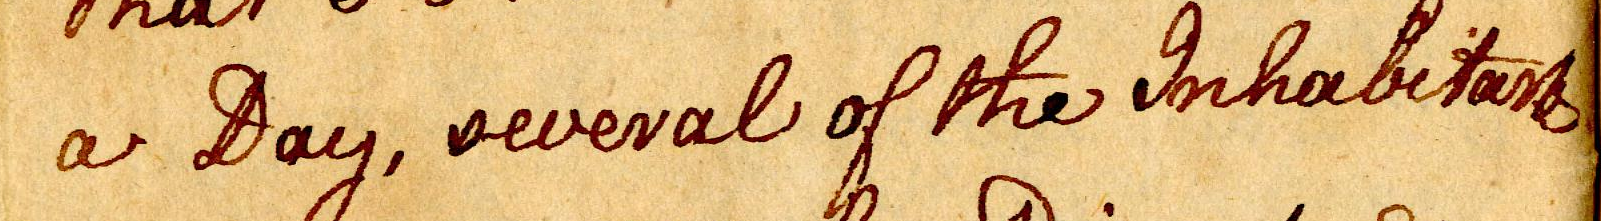a Day, several of the Inhabitants
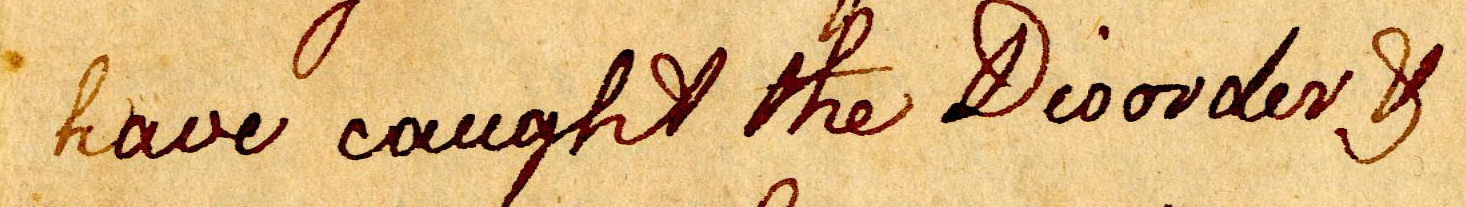have caught the Disorder &
